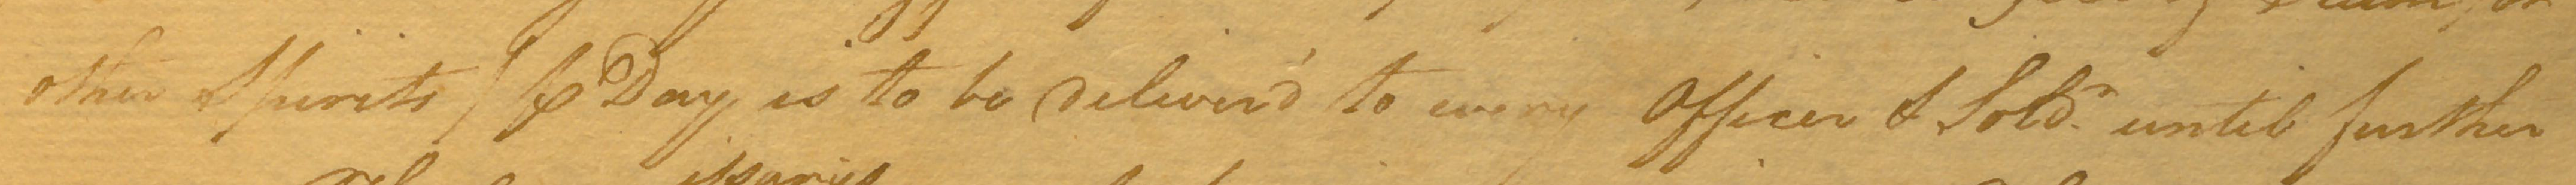other Spirits/ per Day is to be deliver'd to every Officer & Sold^r. until further
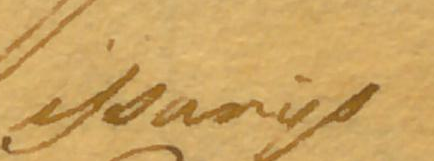issarys
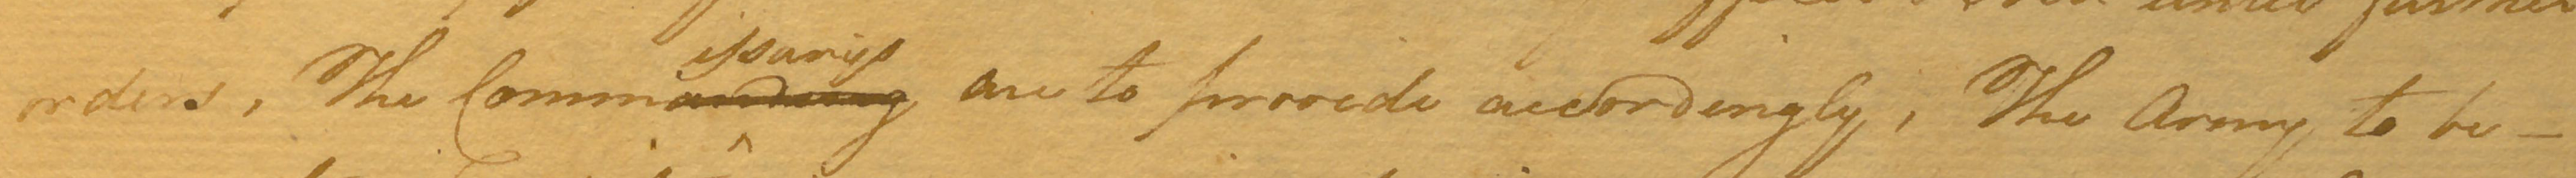orders. The Comm[anding] are to procede accordingly. The army to be-
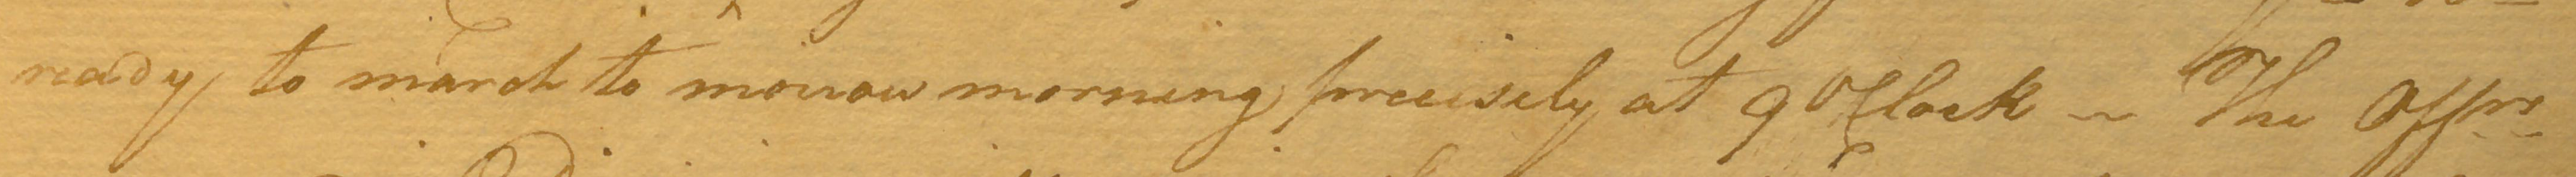ready to march to morrow morning precisely at 9 oClock- The Off^rs.
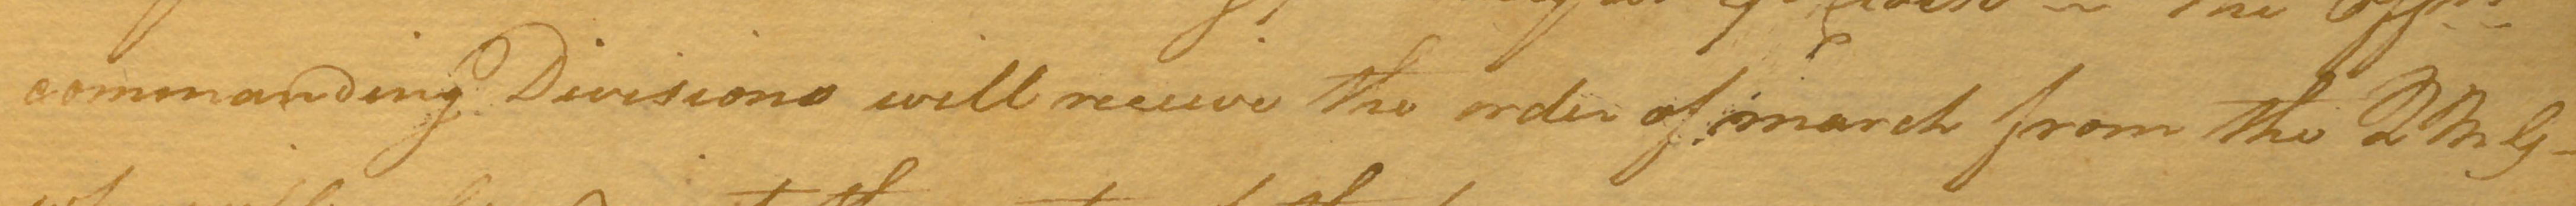commading Divisions will receive the order of march from the Q M G-
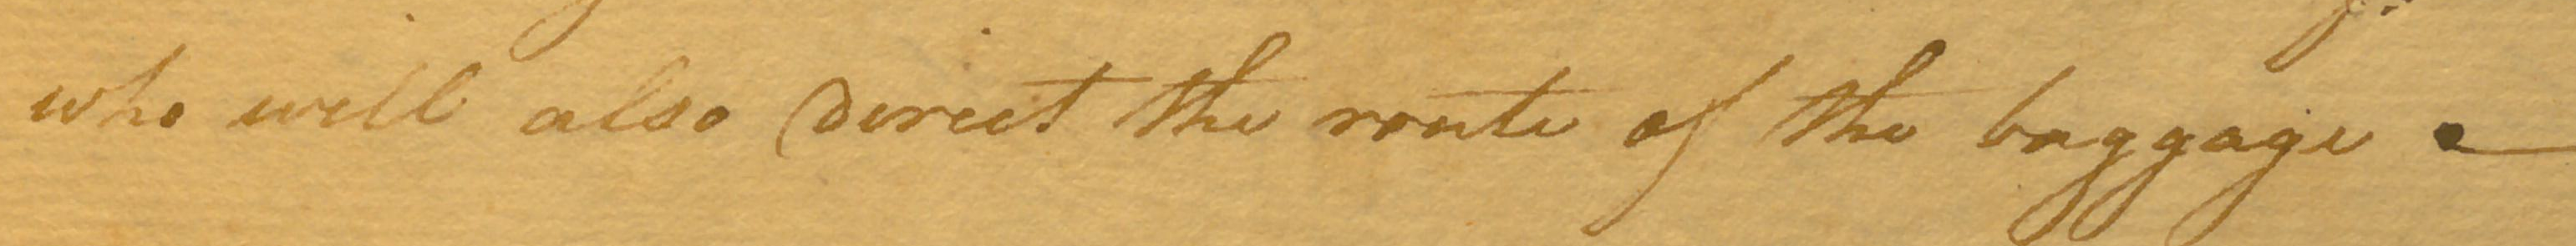who will also direct the route of the baggage.
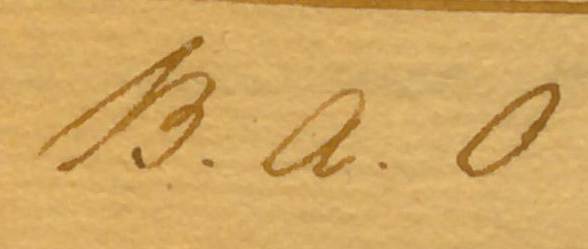B.A.O
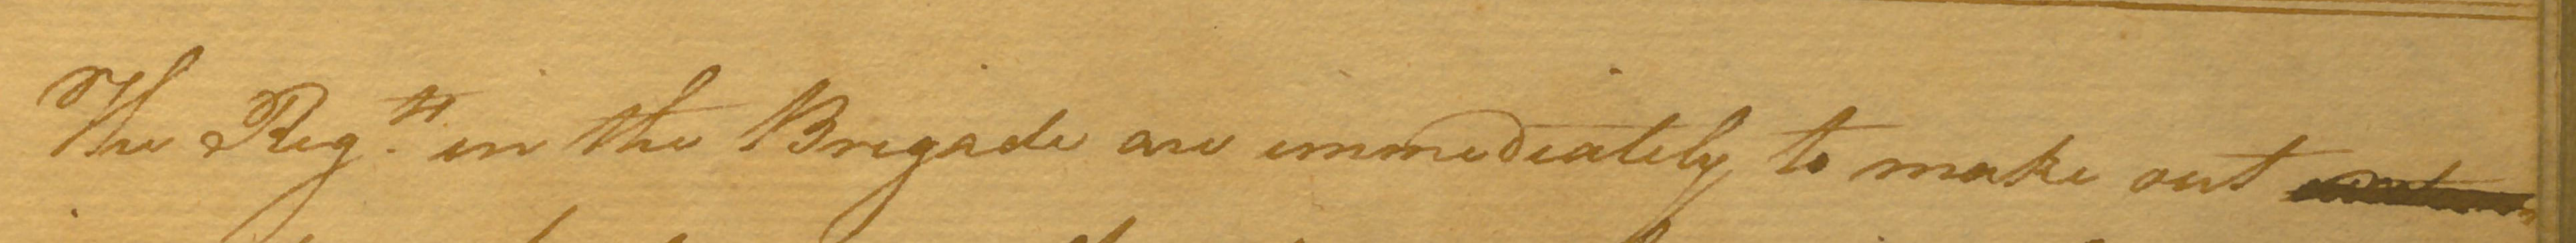The Reg^ts. in the Brigade are immediately to make out [returns]
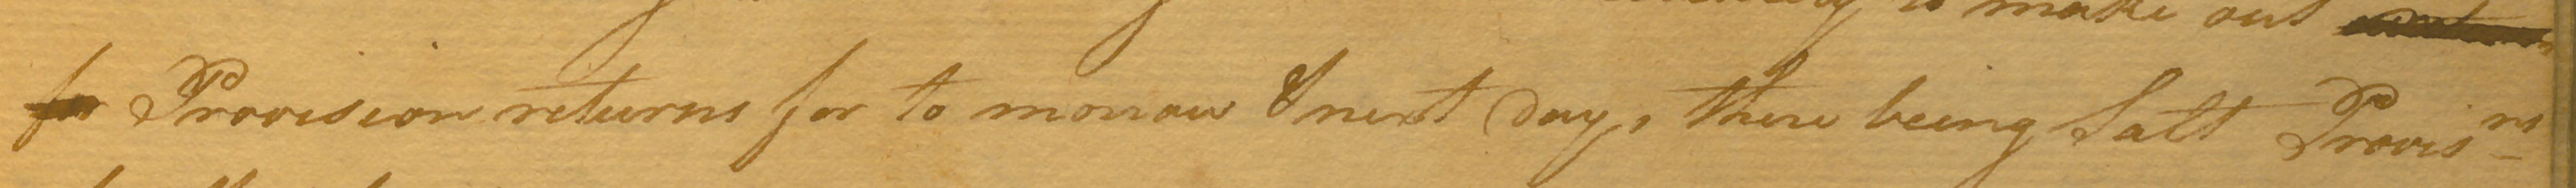[for] Provision returns for to morrow & next day, there being Salt Provis^ns
